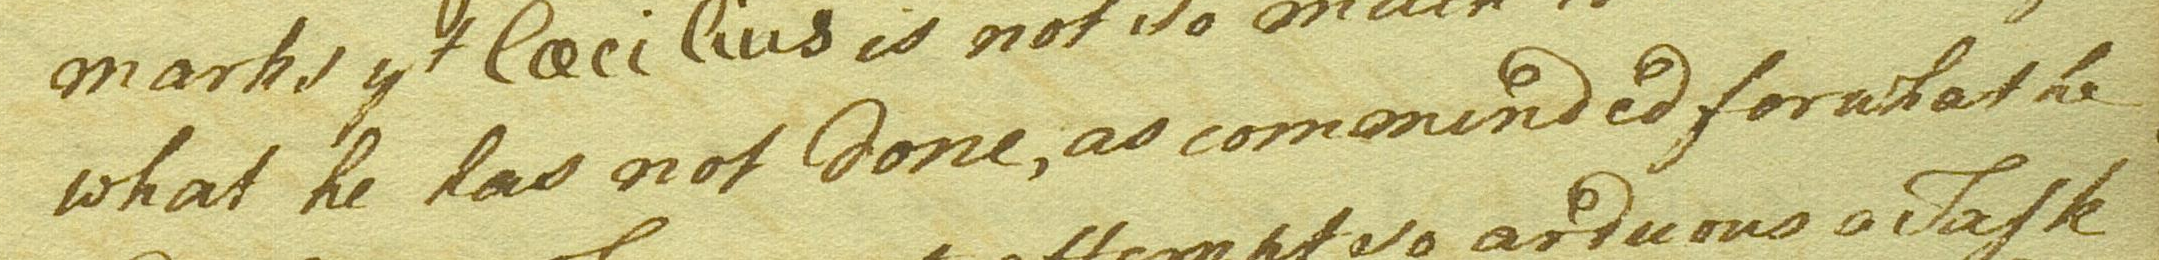what he has not done, as commended for what he
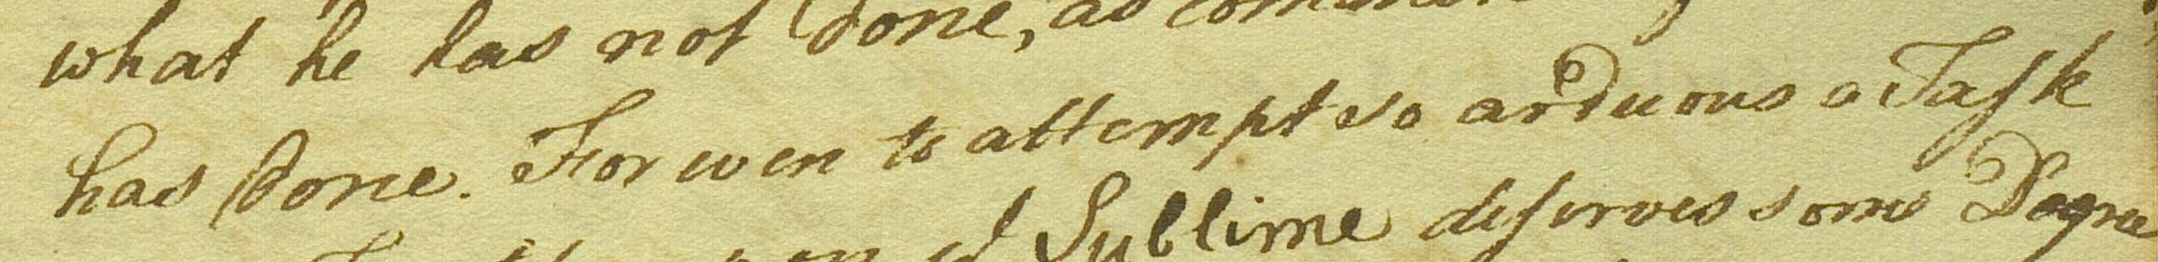has done. For even to attempt so arduous a Task
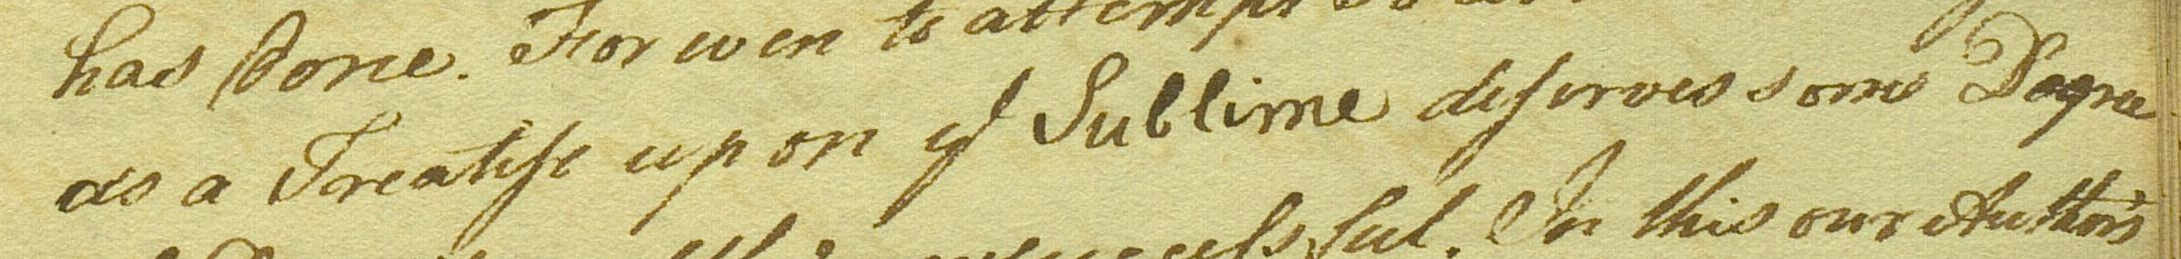as a Treatise upon y^e Sublime deserves some Degree
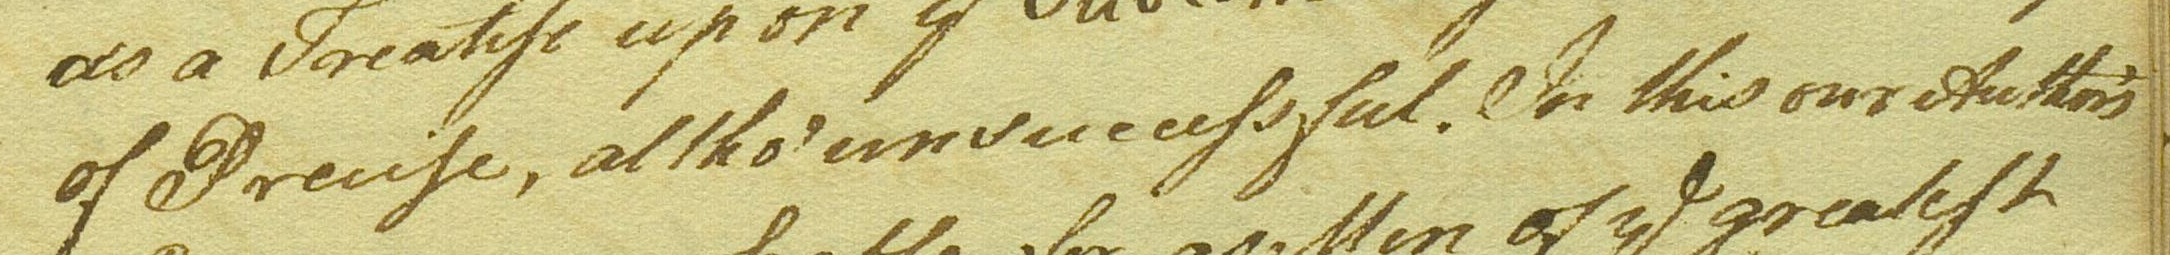of Precise, altho' unsuccessful. In this our Author's
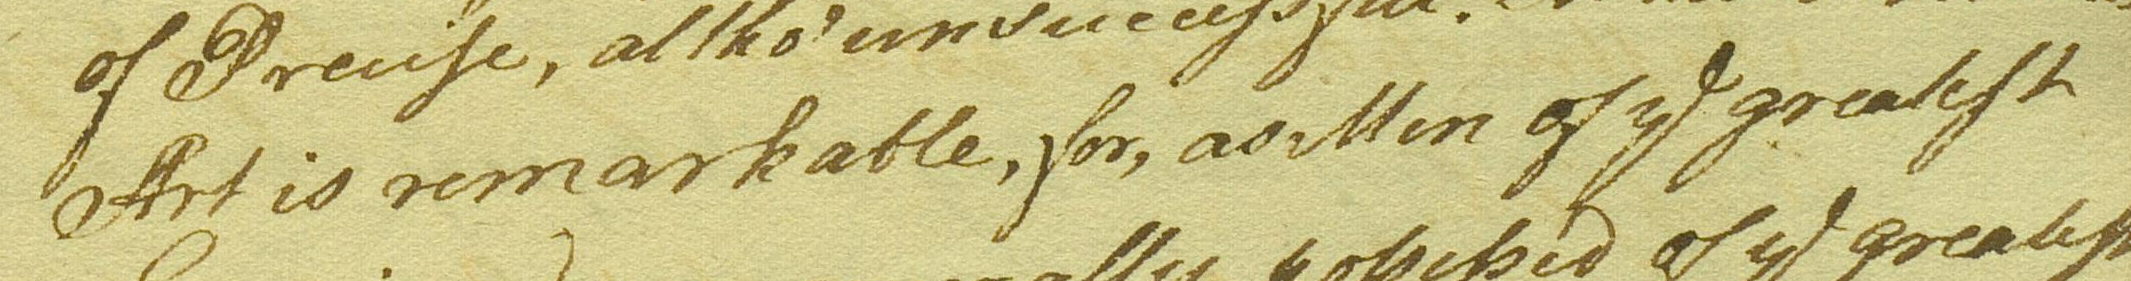Art is remarkable, for, as Men of y^e greatest
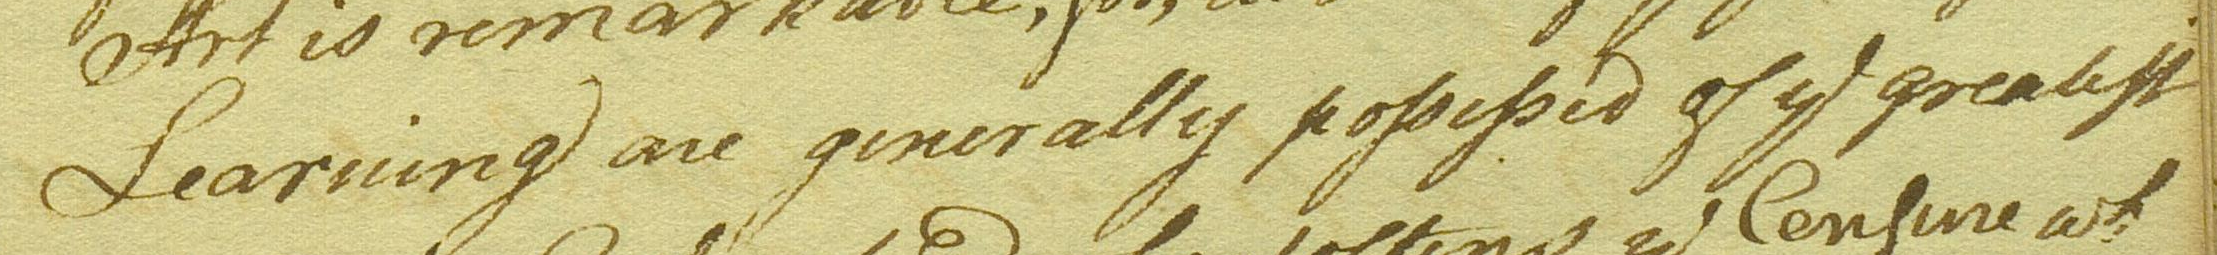Learning are generally possessed of y^e greatest
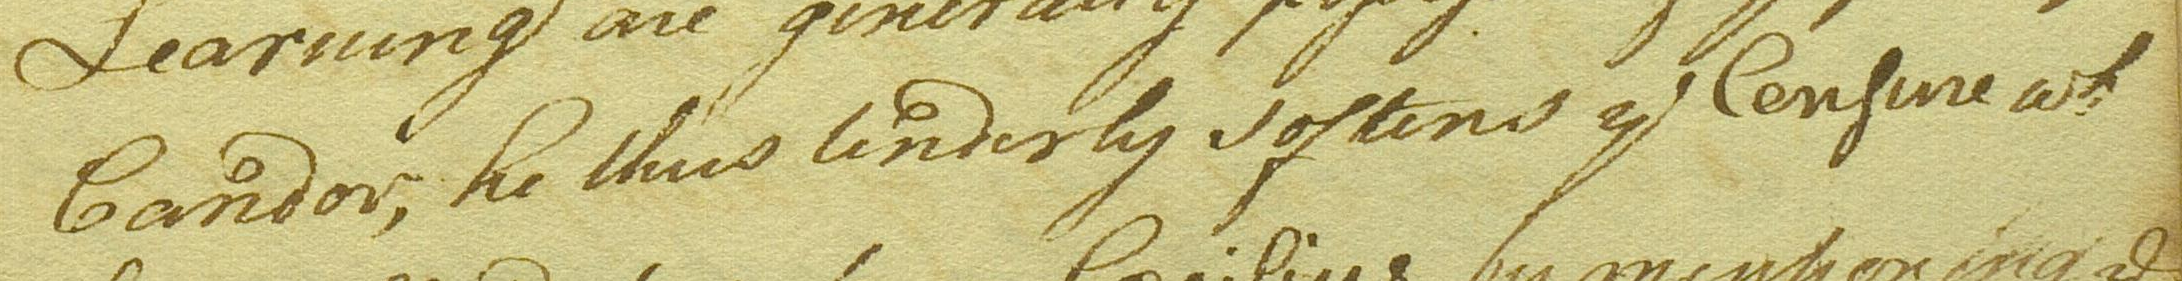Candor, he thus tenderly softens y^e Censure w^h
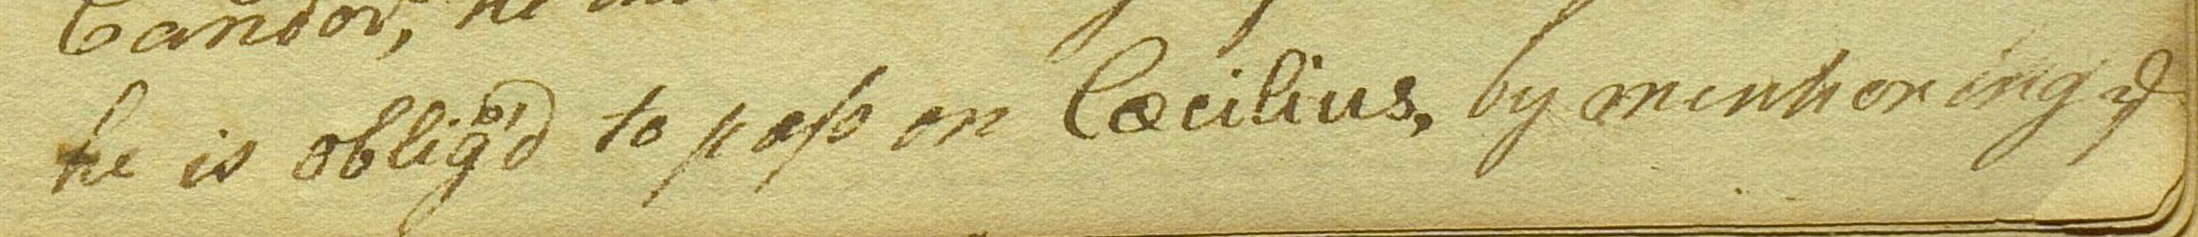he is oblig'd to pass on Caecilius, by mentioning y^e
